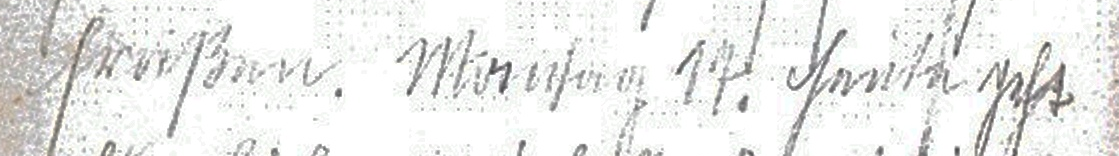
fraßen. Montag 17. heute geht
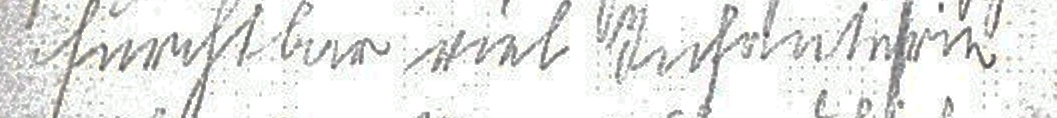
furchtbar viel Infanterie
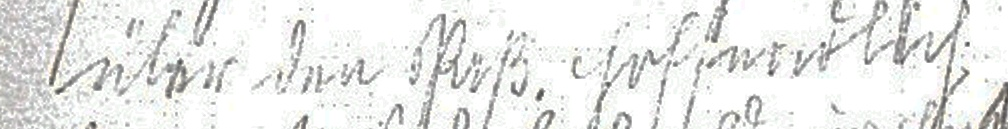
über den Paß. Hoffentlich
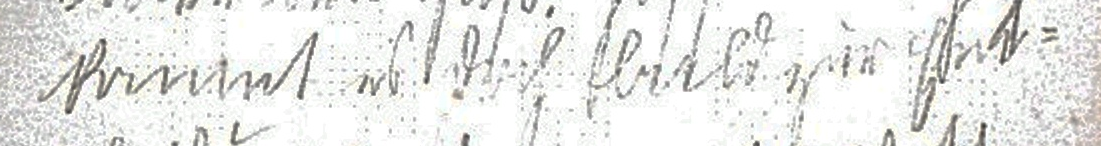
kommt es doch bald zur Ent=
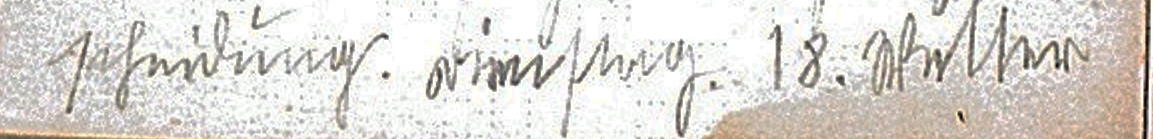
scheidung. Dienstag.18. Wetter
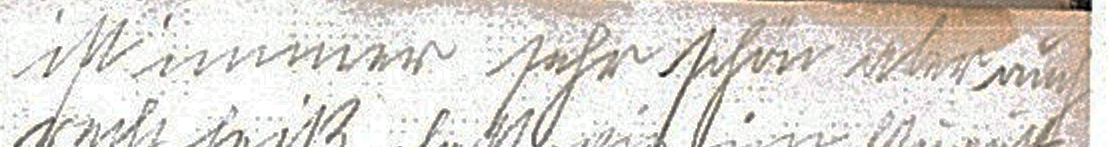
ist immer sehr schön aber auch
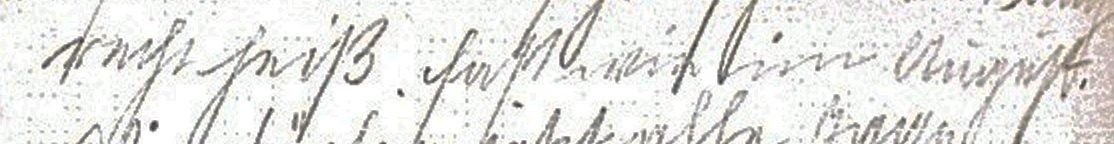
recht heiß. Fast wie im August.
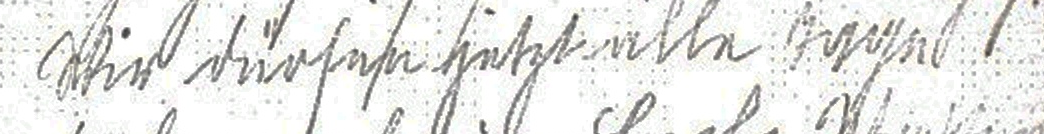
Wir dürfen jetzt alle Tage
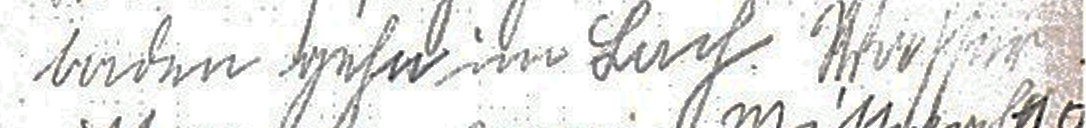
baden gehn im Bach. Wasser
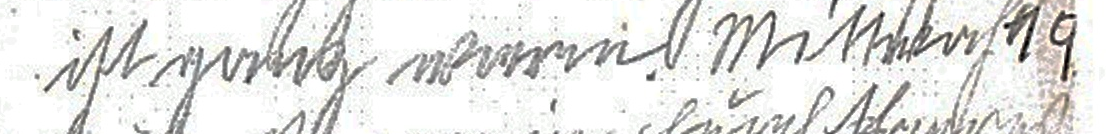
ist ganz warm. Mittwoch 19.
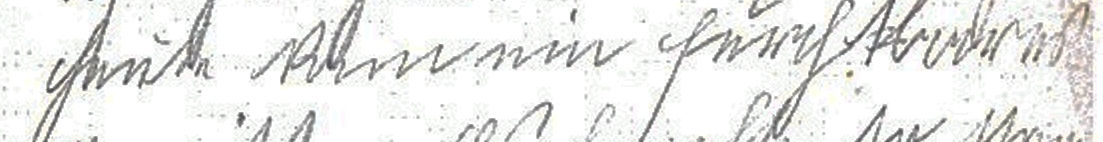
heute kam ein furchtbares
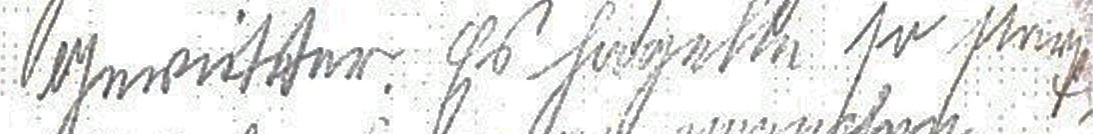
Gewitter. Es hagelte so stark
